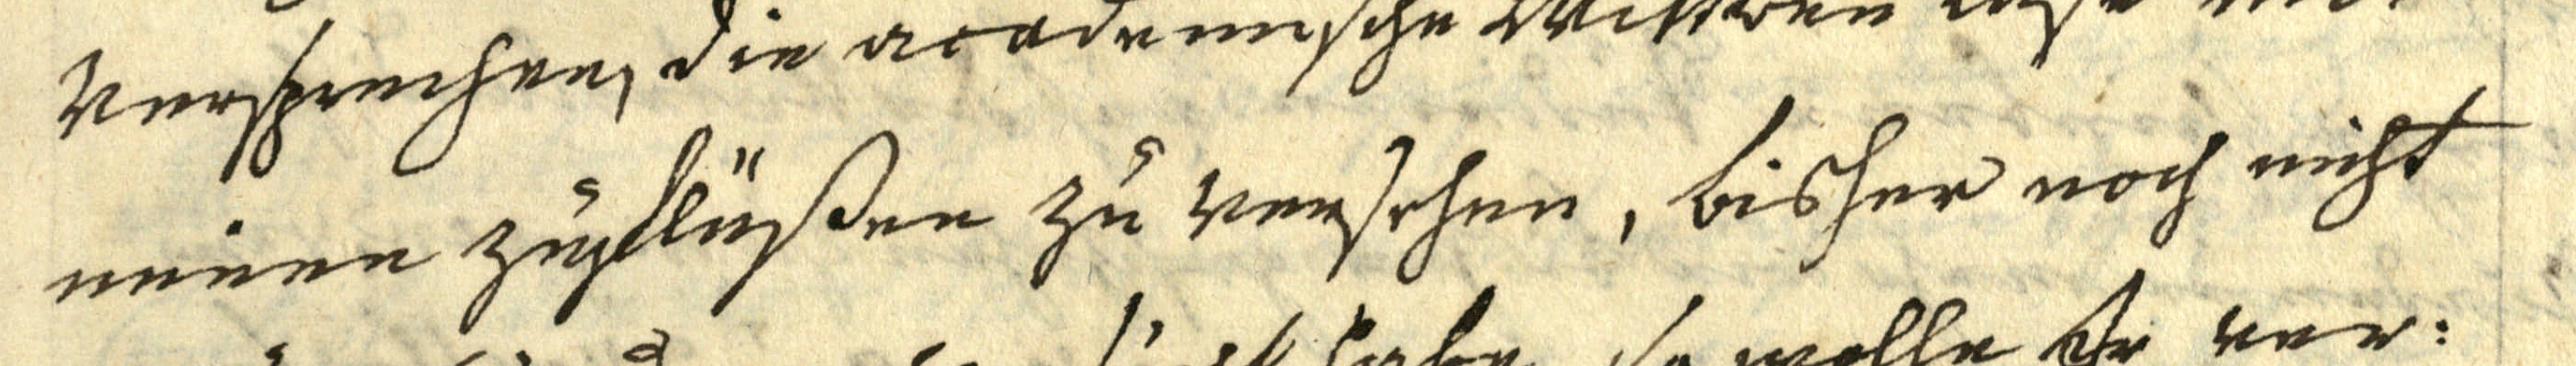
neuen zuflüßen zu versehen, bisher noch nicht
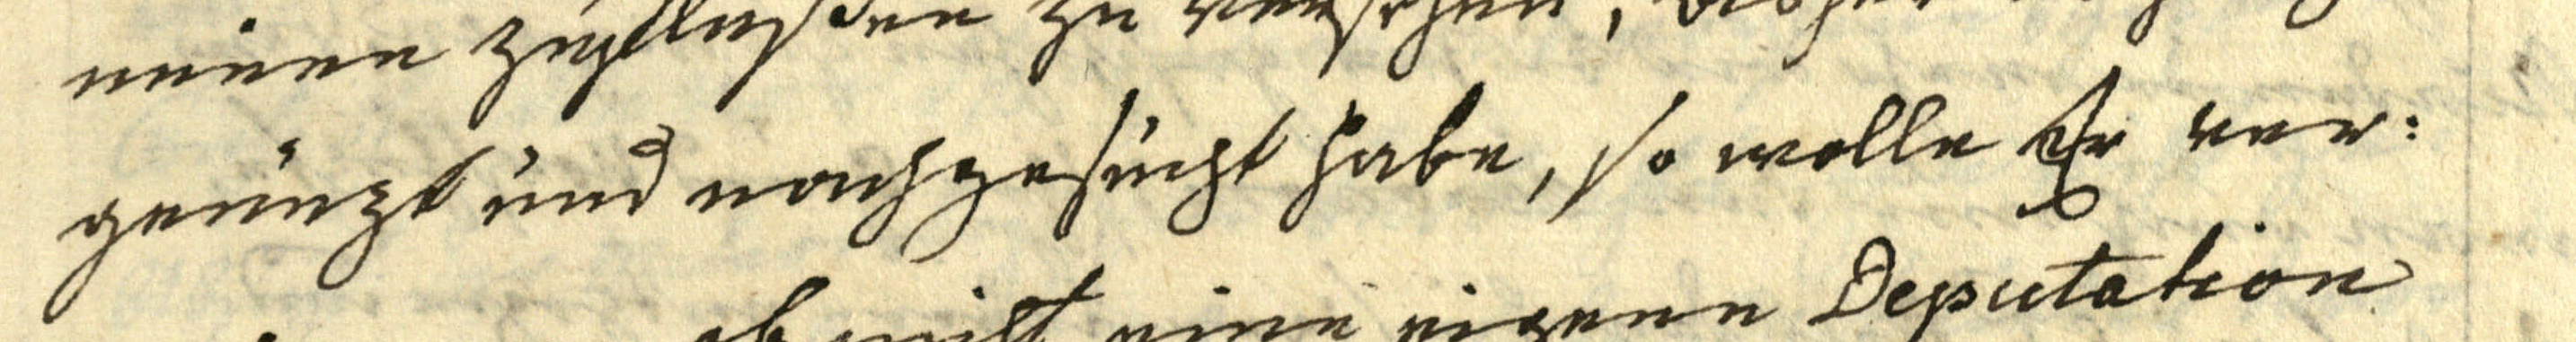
genüzt und nachgesucht habe, so wolle Er ver¬
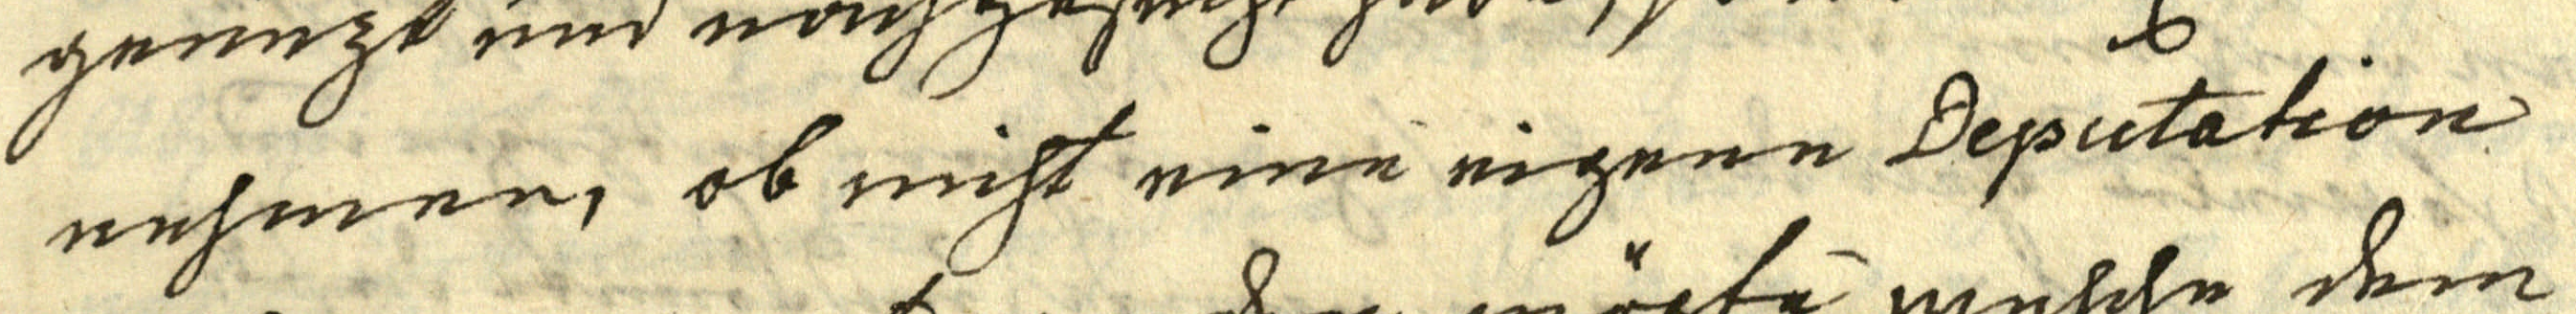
nehmen, ob nicht eine eigene Deputation
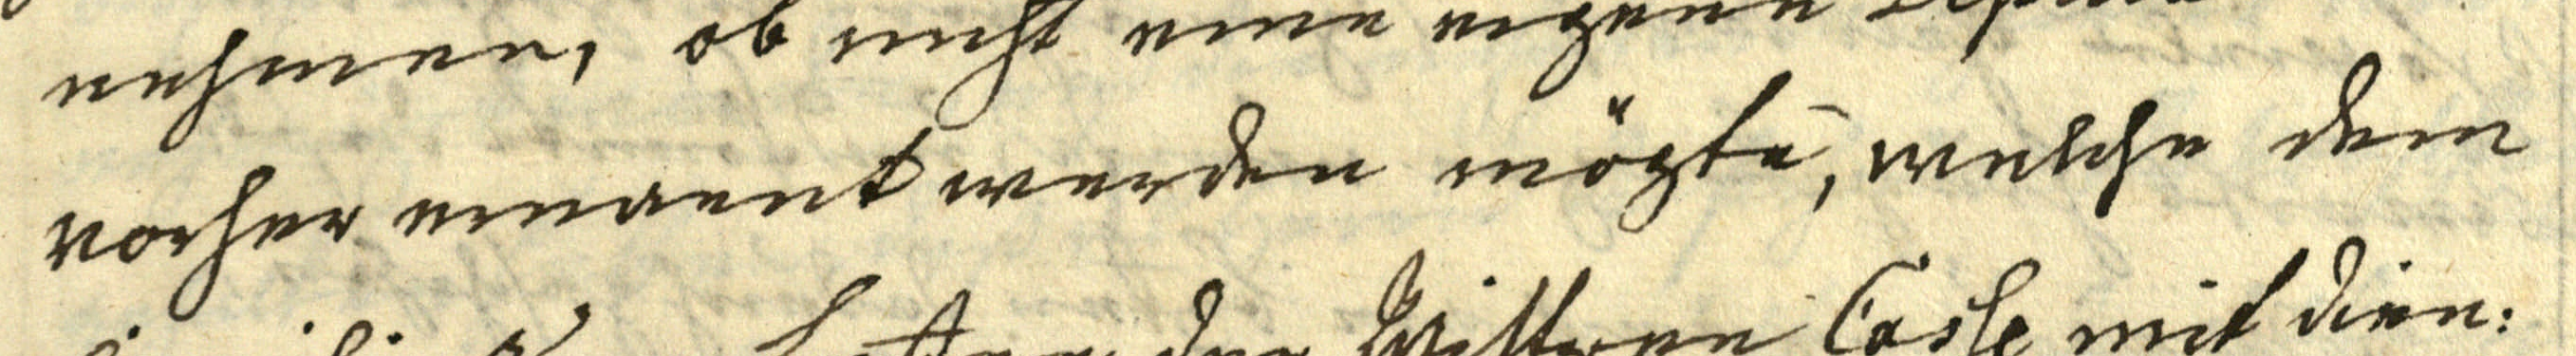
vorher ernannt werden mögte, welche dem
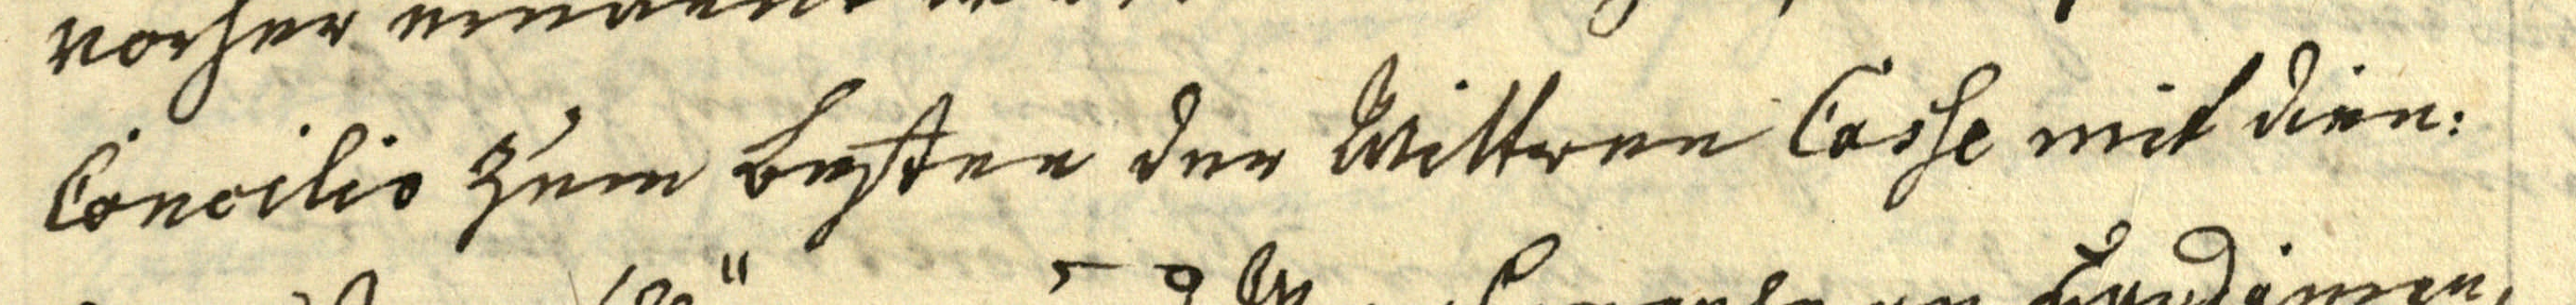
Concilio zum Besten der Wittwen Casse mit dien¬
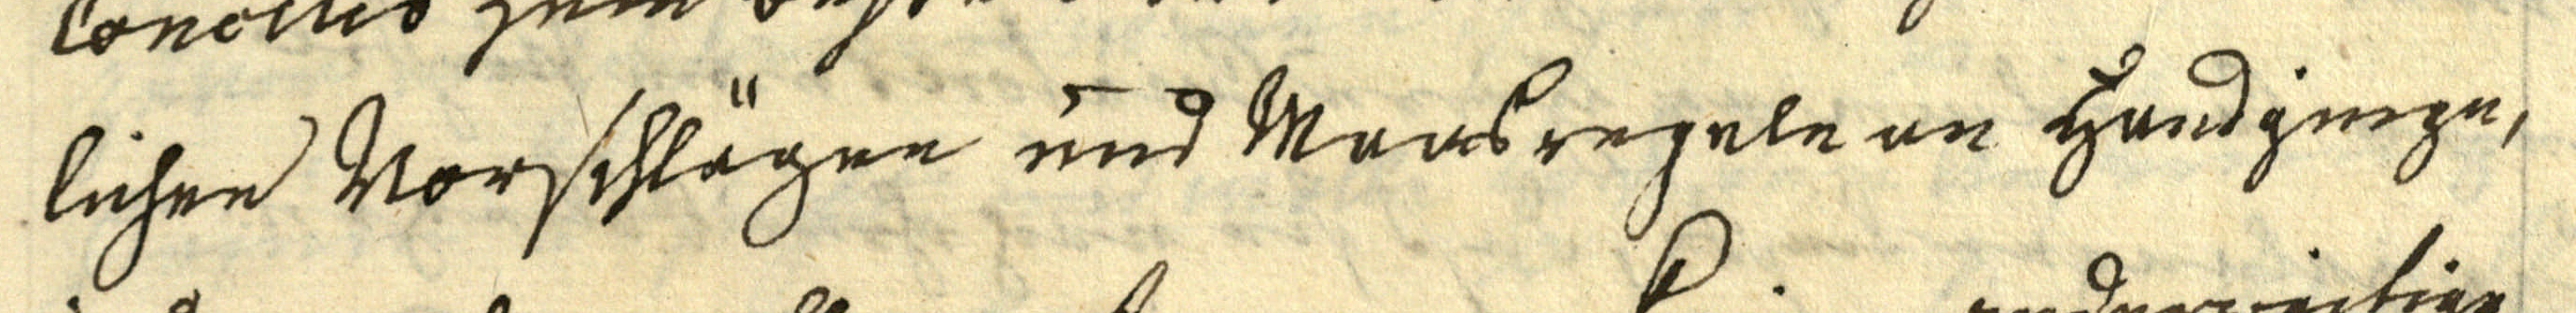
lichen Vorschlägen und Maasregeln an Hand ginge,
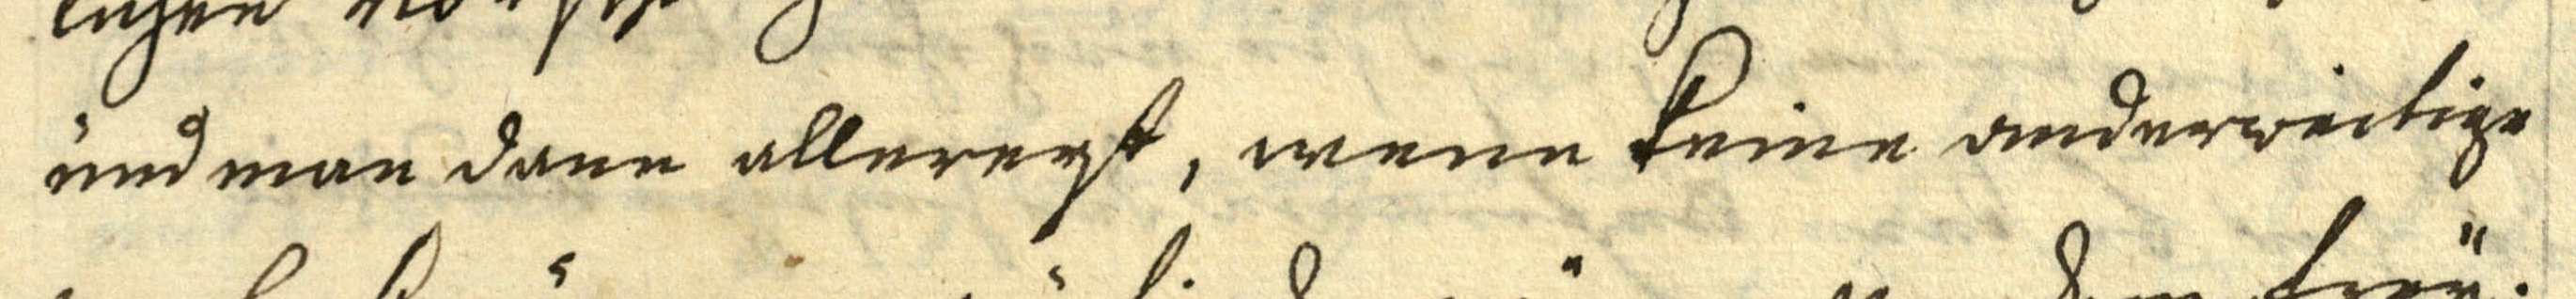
und man dann allererst, wenn keine anderweitige
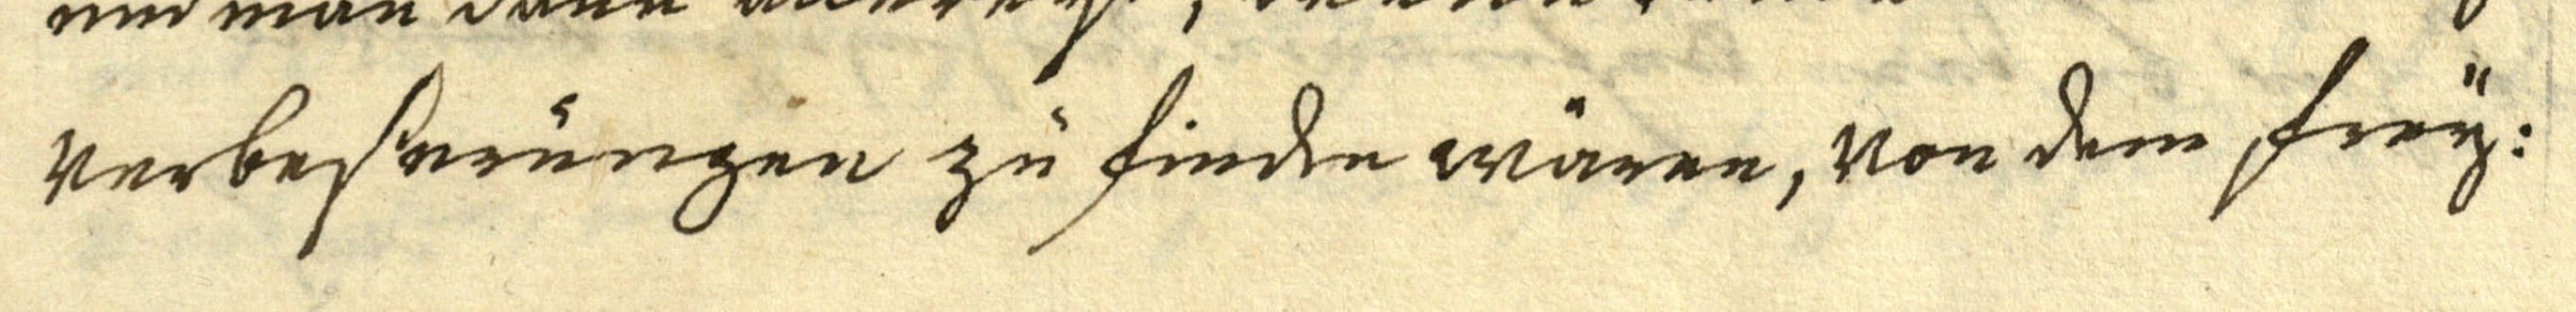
Verbesserungen zu finden wären, von dem freÿ¬
